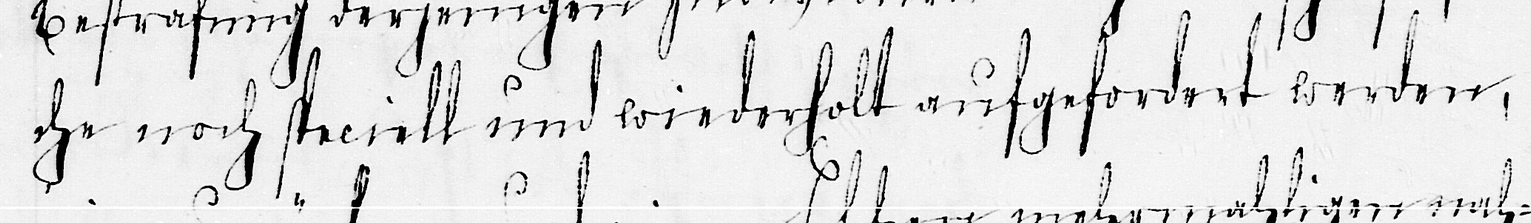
che noch speciell und wiederholt aufgefordert werden,
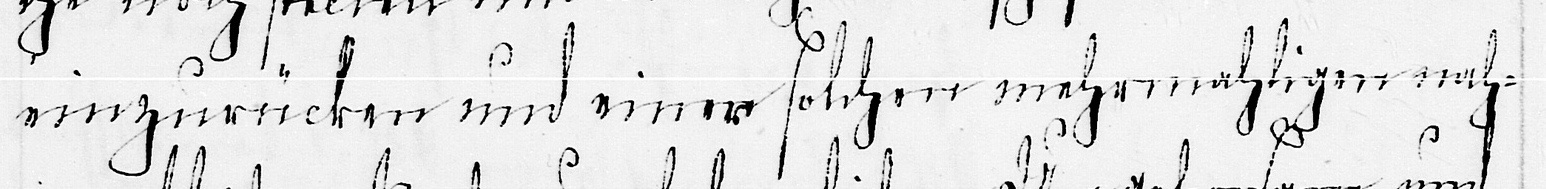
einzurücken und einer solchen mehrmahligen nah¬
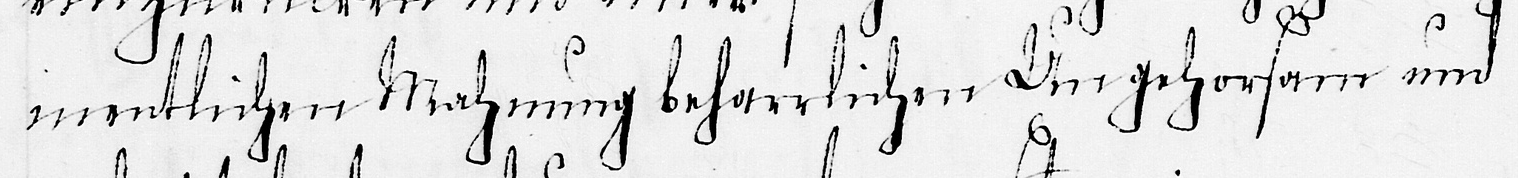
mentlichen Mahnung beharrlichen Ungehorsam und
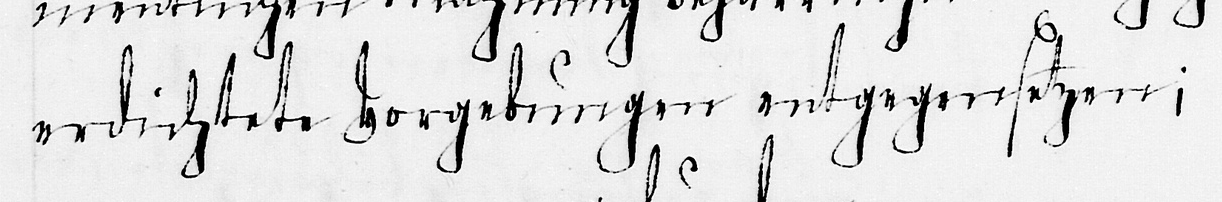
erdichtete Vorgebungen entgegensetzen;
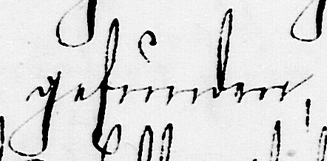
gefunden,
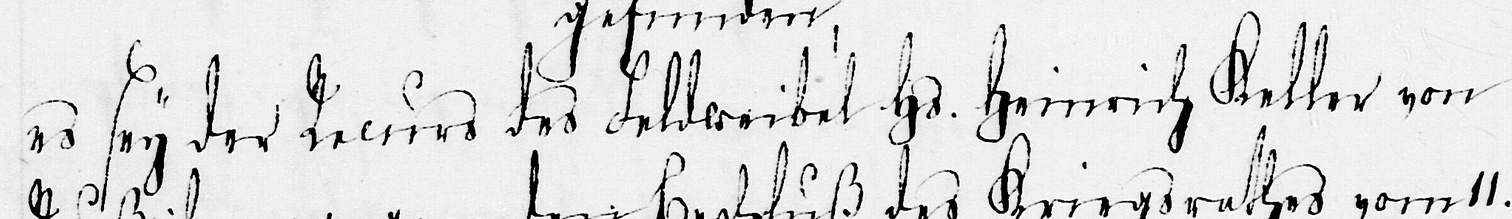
es sey der Recurs des Feldweibel Hs. Heinrich Keller von
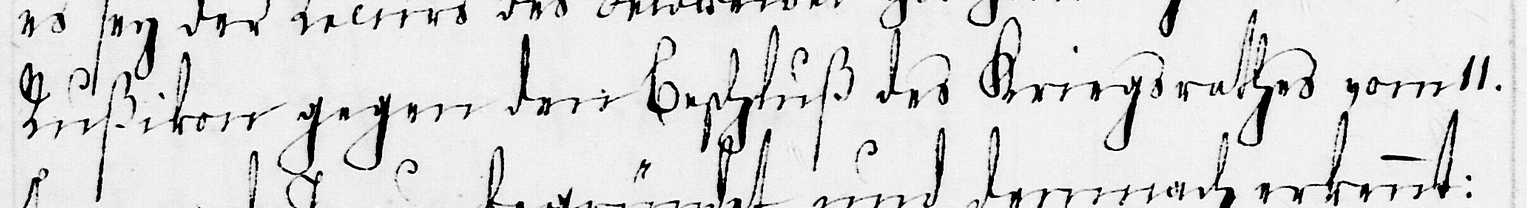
Rußikon gegen den Beschluß des Kriegsrathes vom 11.
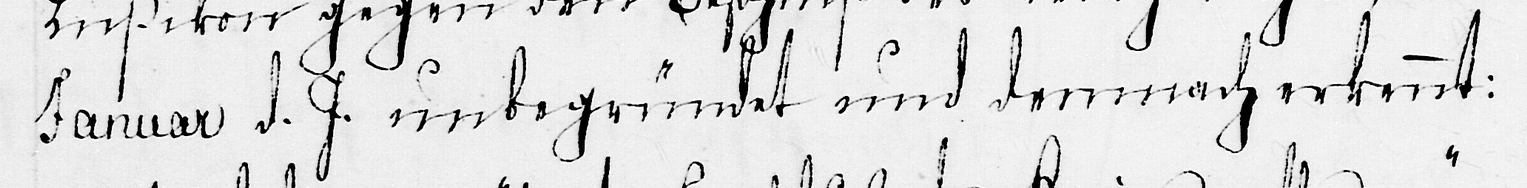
Januar d. J. unbegründet und demnach erkennt:
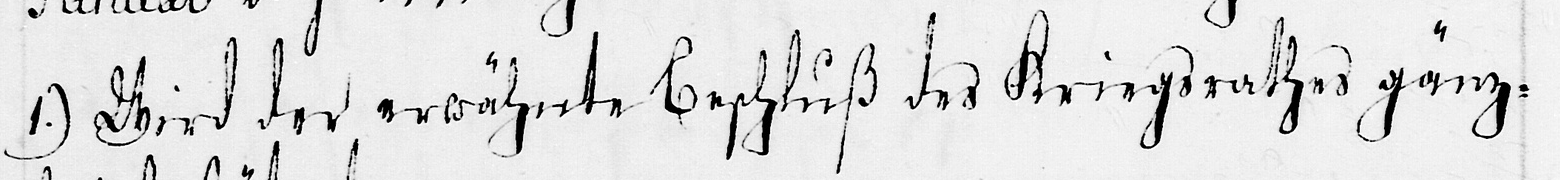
1.) Wird der erwähnte Beschluß des Kriegsrathes gänz¬
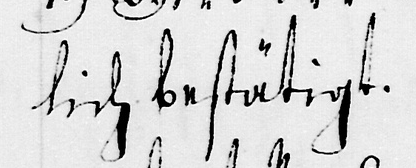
lich bestätigt.
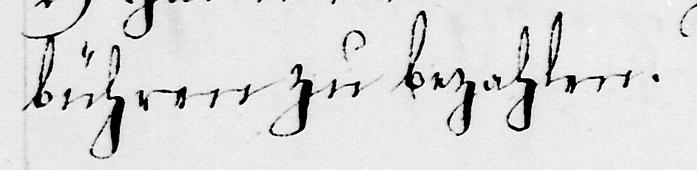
ebühren zu bezahlen.
